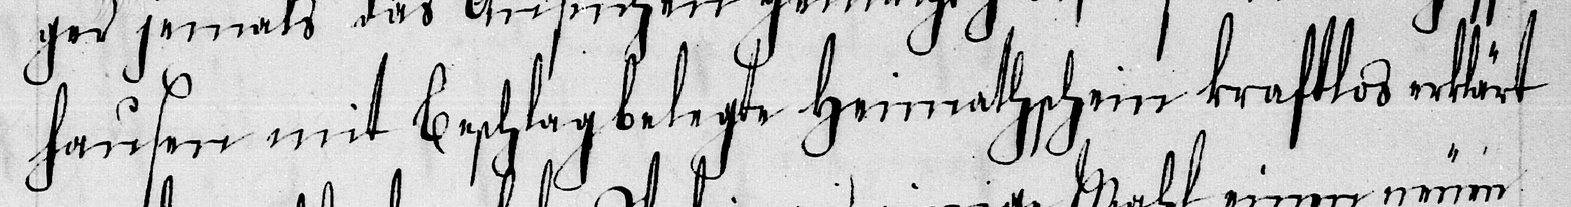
hausen mit Beschlag belegte Heimathschein kraftlos erklärt
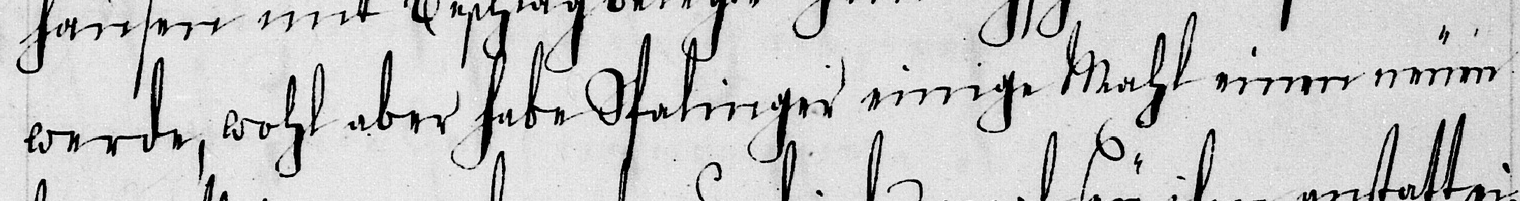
werde, wohl aber habe Spalinger einige Mahl einen neuen
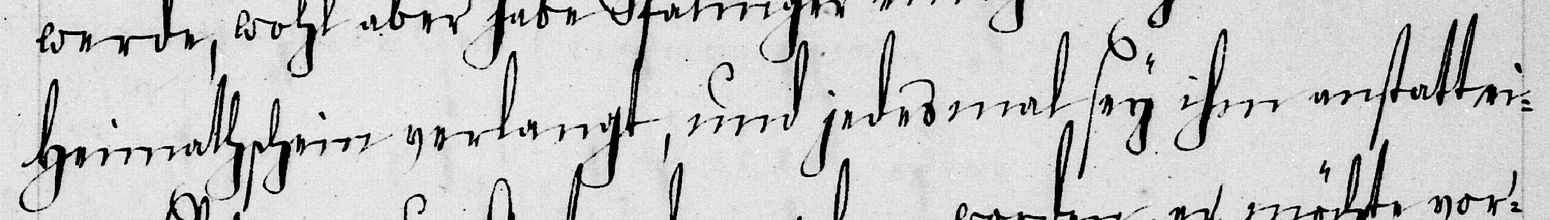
Heimathschein verlangt, und jedesmal sey ihm anstatt e¬
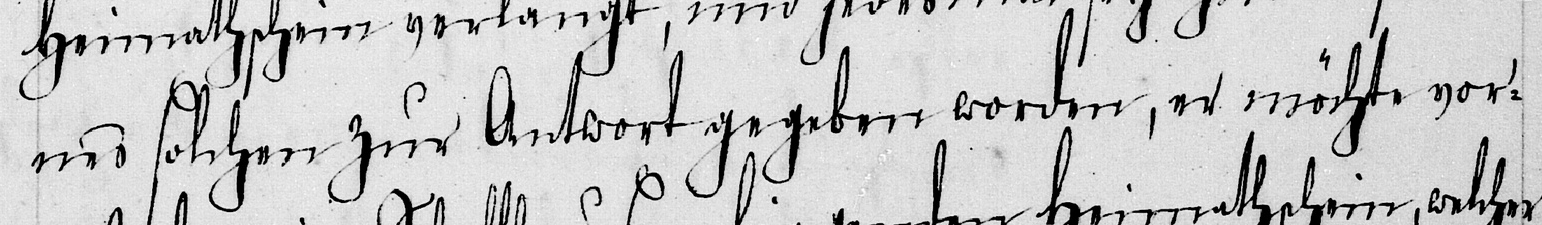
ines solchen zur Antwort gegeben worden, er möchte vor¬
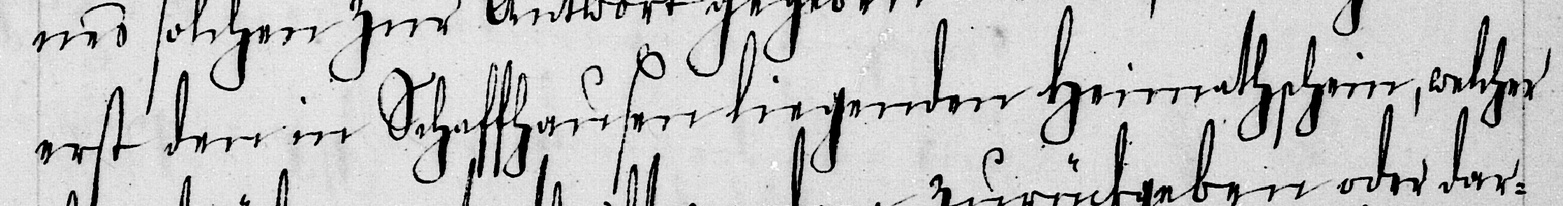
erst den in Schaffhausen liegenden Heimathschein, welc¬
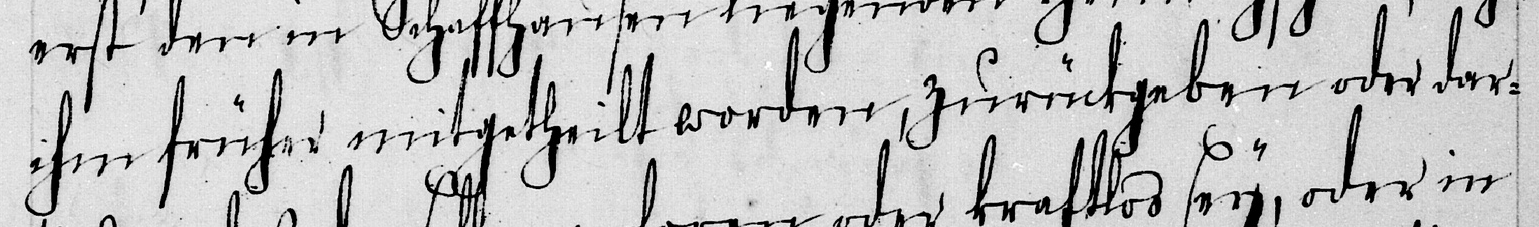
ihm früher mitgetheilt worden, zurückgeben oder dar¬
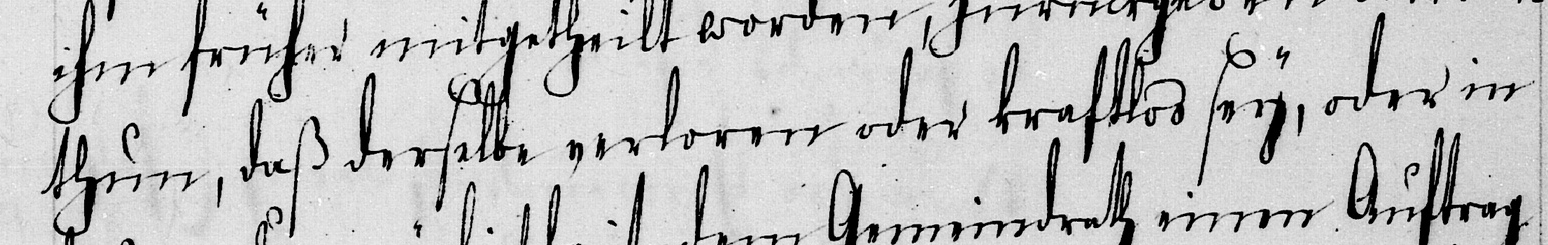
thun, daß derselbe verloren oder kraftlos sey, oder in
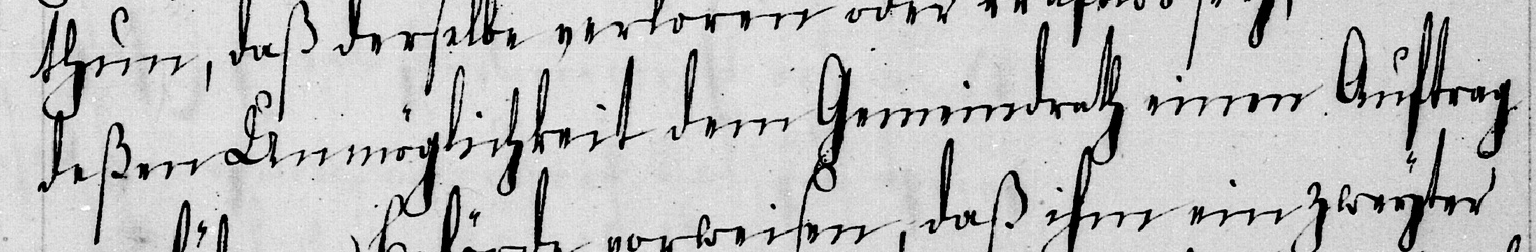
deßen Unmöglichkeit dem Gemeindrath einen Auftrag
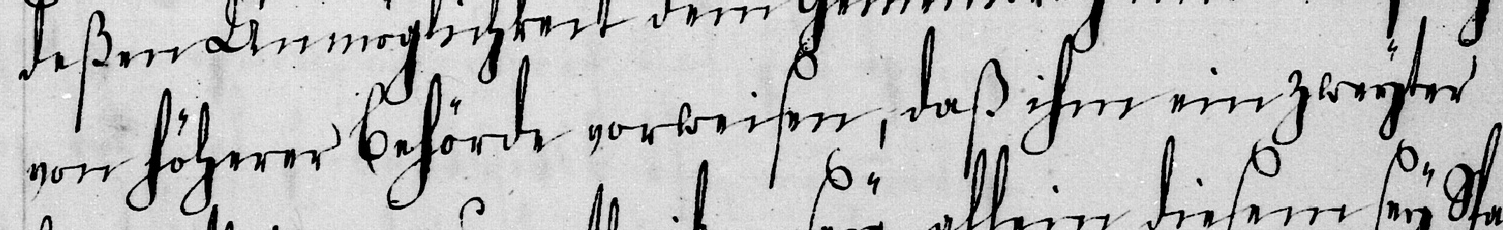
von höherer Behörde vorweisen, daß ihm ein zweyter
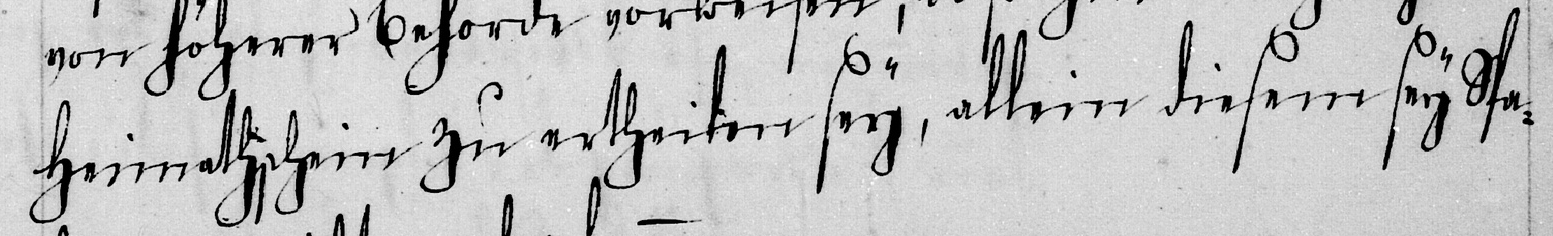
Heimathschein zu ertheilen sey, allein diesem sey Sp¬
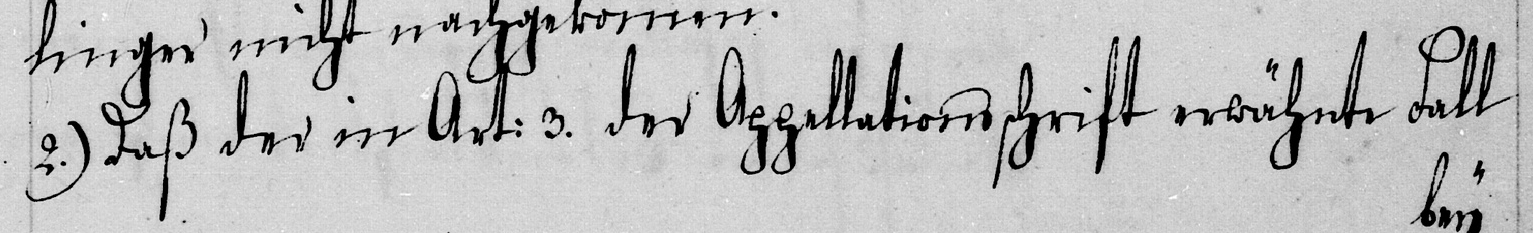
2.) Daß der in Art: 3. der Appellationsschrift erwähnte Fall
